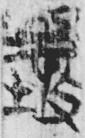襄（穰）
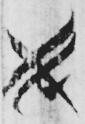民
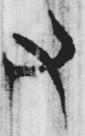又（有）
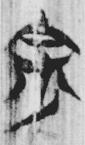余（餘）
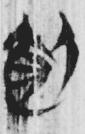飤（食）
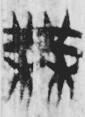無
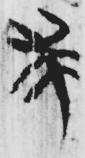求
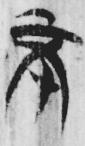不
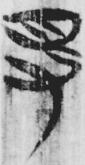○（得）
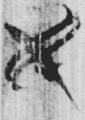民
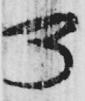乃
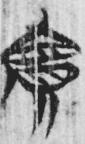賽
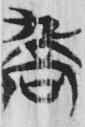喬（驕）
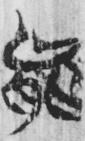能（態）
